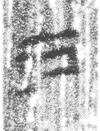母
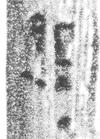○（教）
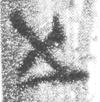之
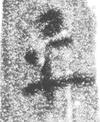七
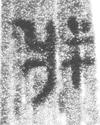歲（歲）
